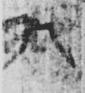九
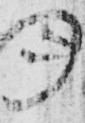月
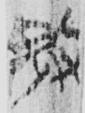○（除）
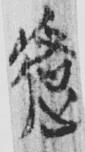○（路）
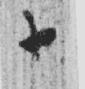十
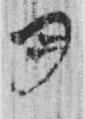月
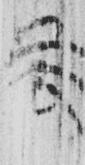而
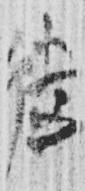徒
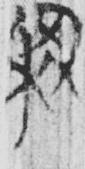○（梁）
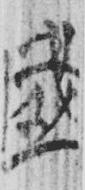城（成）
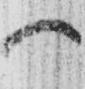一
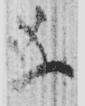之
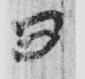日
